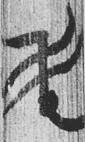民
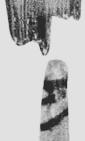乍（詛）
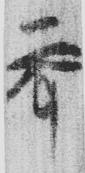而
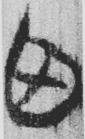甶（思）
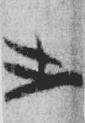之
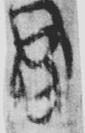君
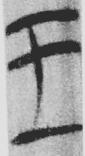王
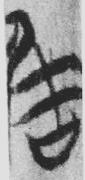唯
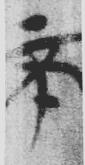不
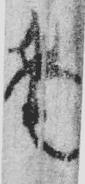年
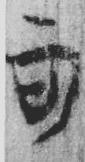可
